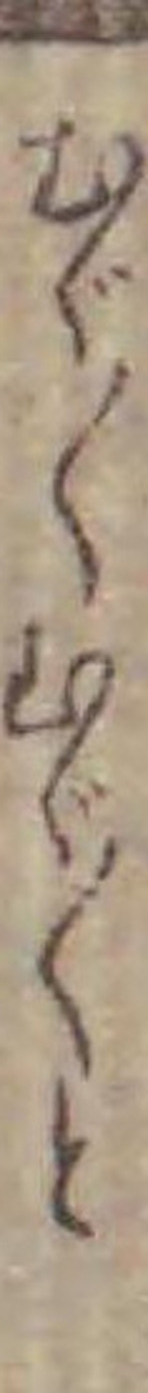むぐ〳〵むぐ〳〵と
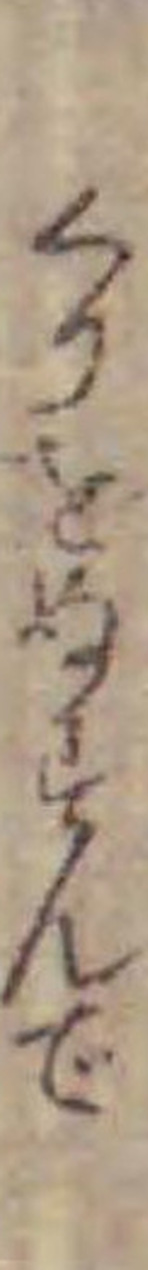くりをぬすんで
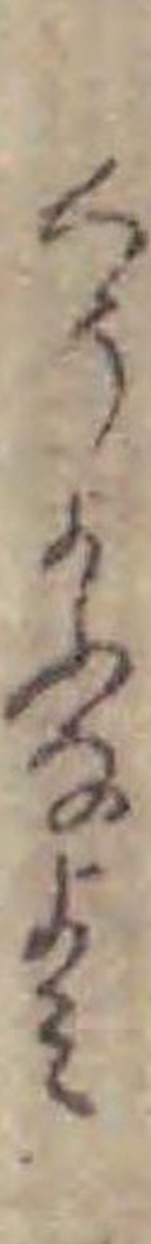くうよふなよみ
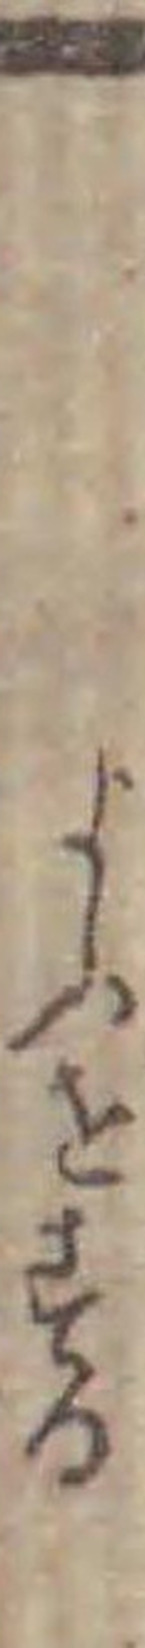よふをする
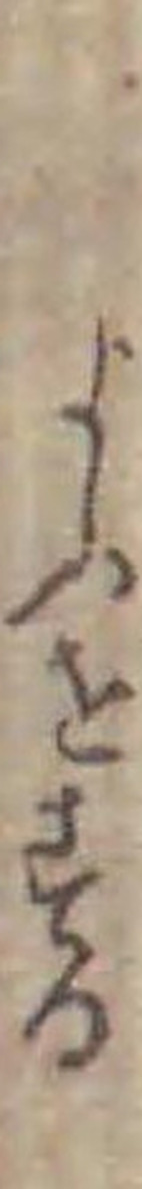よふをする
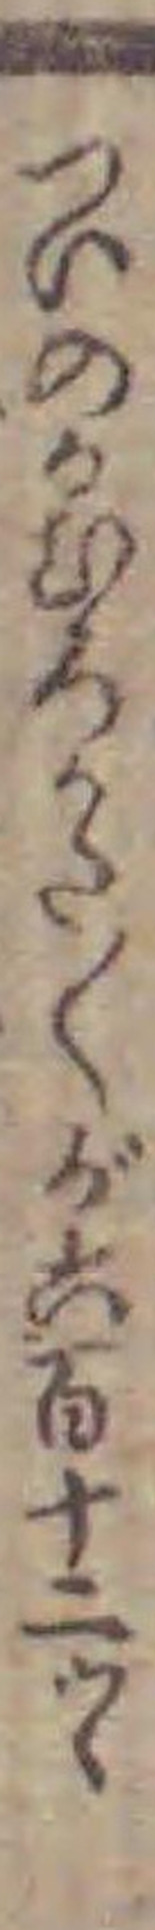ついのかむろかた〳〵が六百十二ヽ
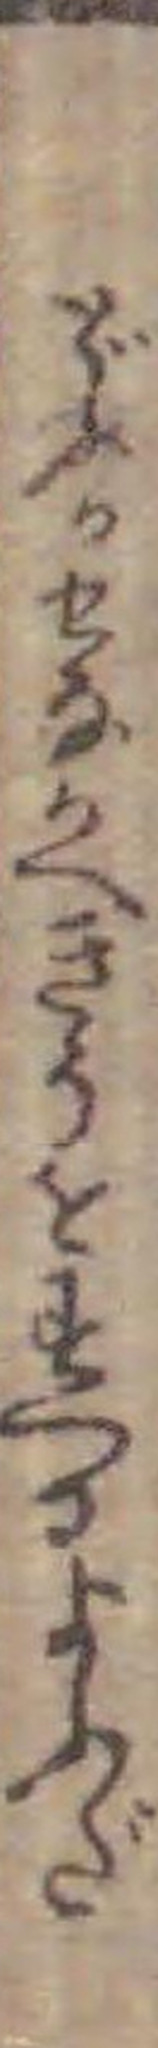どふかせなかへきうをすへるよふだ

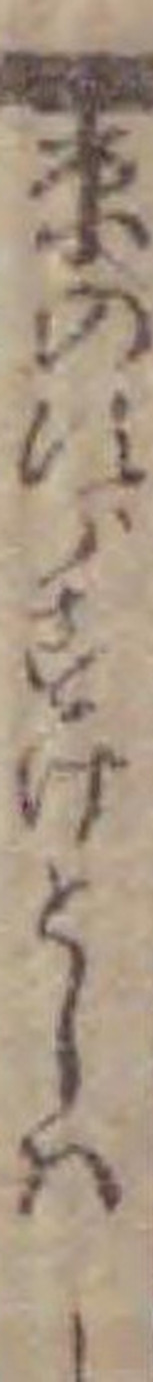京の須郎すけとしは
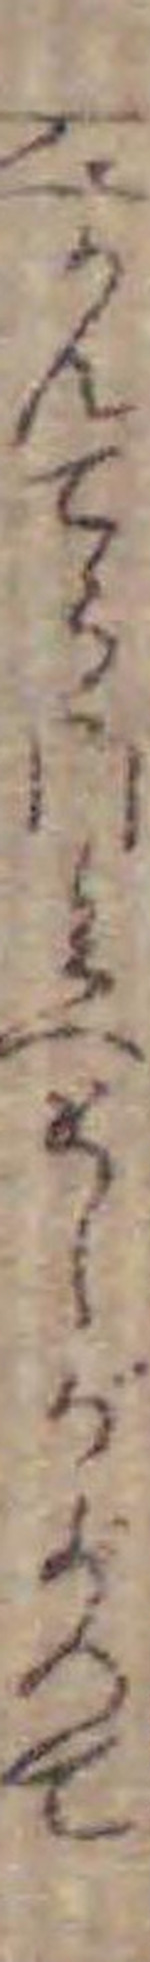かんてら門とみへとしがよつて
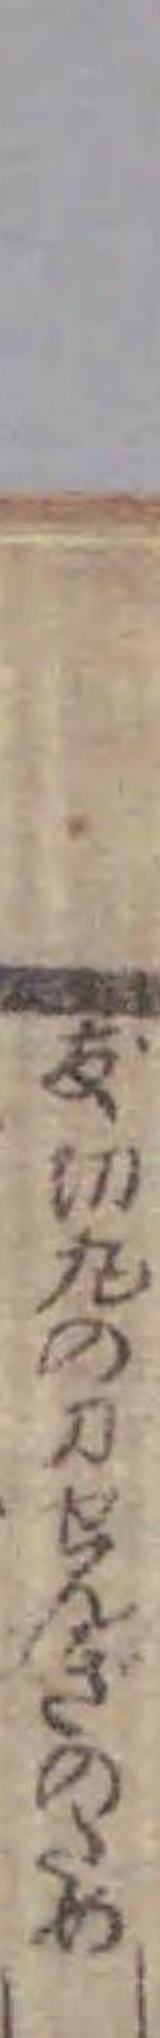友切丸の刀せんぎのため
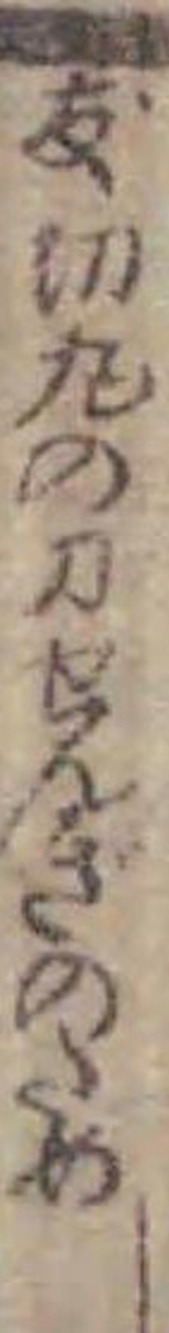友切丸の刀せんぎのため
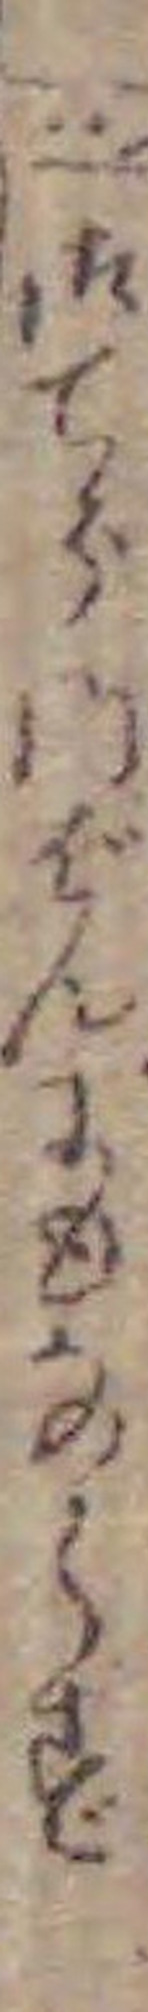御てら門ばんにもならず
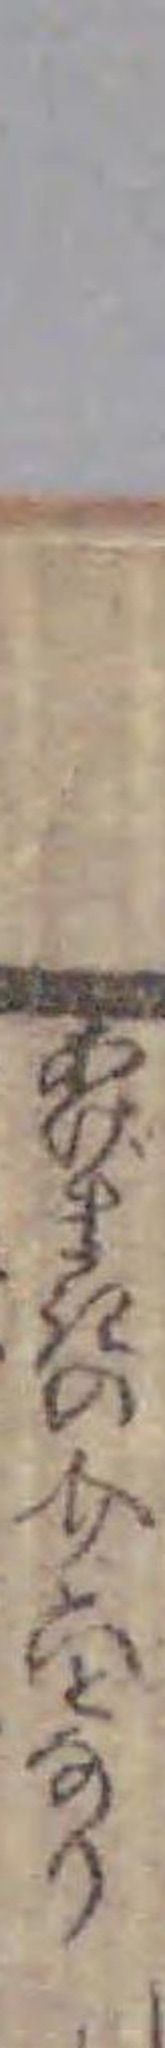あげまきの介六となり
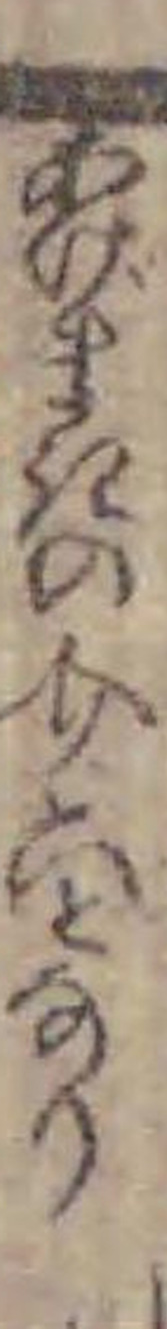あげまきの介六となり
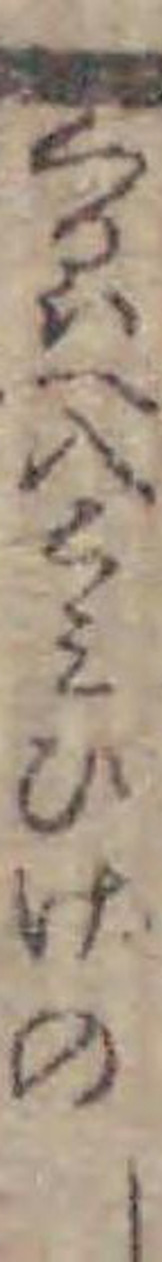くるはへ入くみひげの
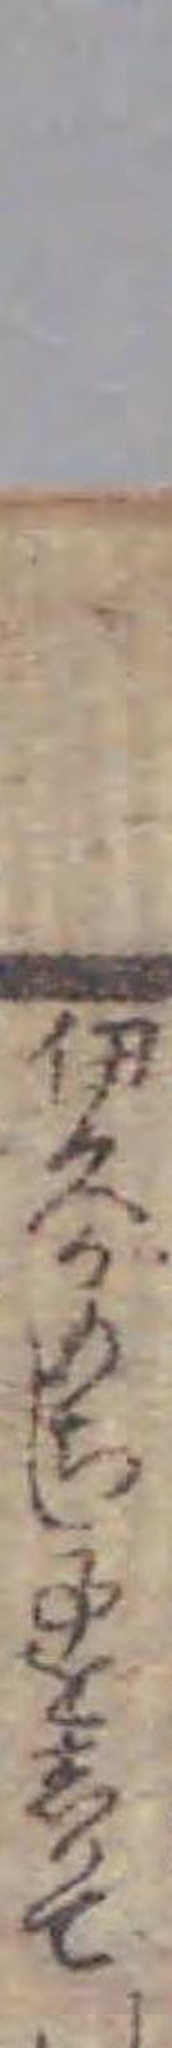伊久がもちし事をしりて
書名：年寄之冷水曽我 : 3巻
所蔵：国立国会図書館 National Diet Library, JAPAN
